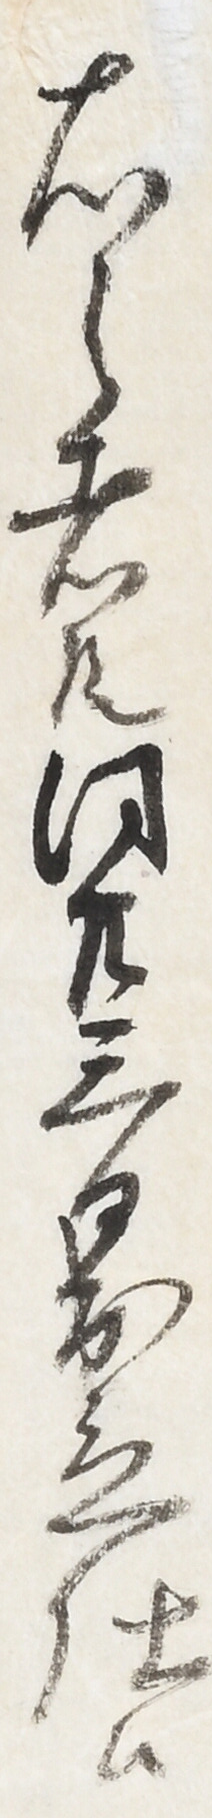右之者共同廿三日出立仕候
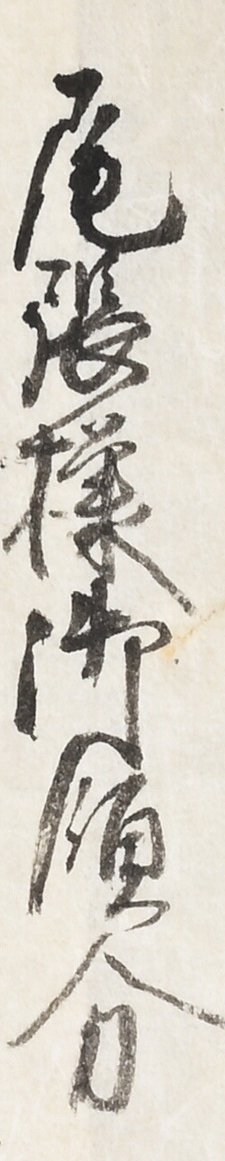尾張様御領分
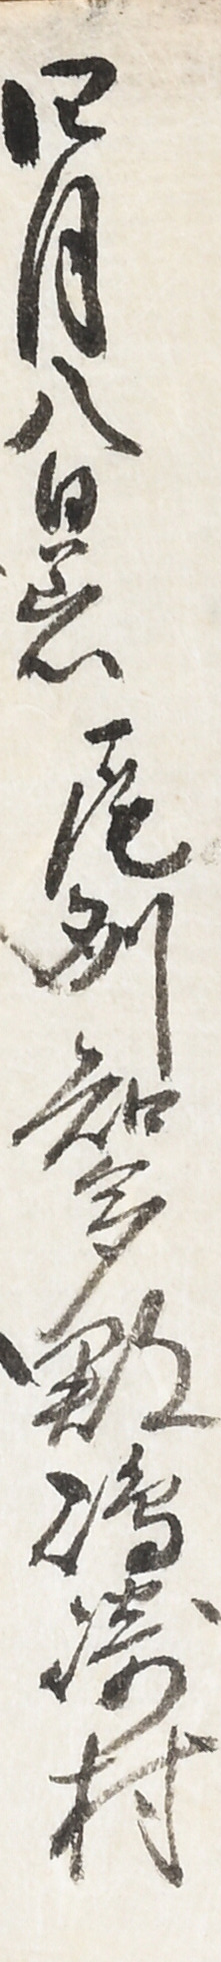四月八日着尾州知多郡嶋崎村
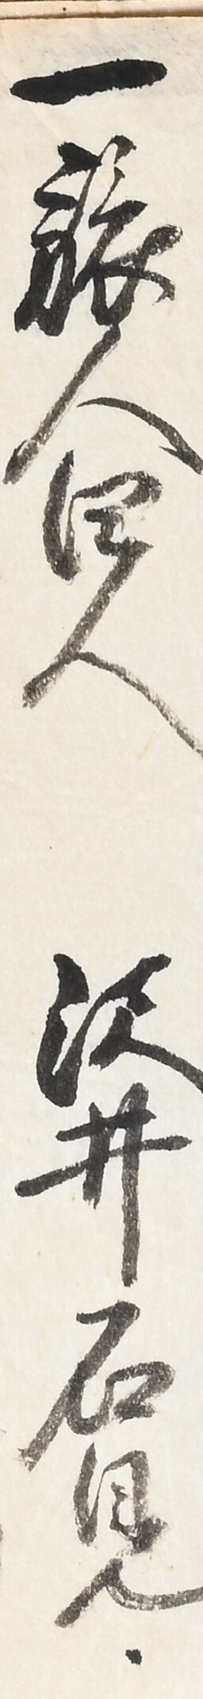一旅人四人沢井石見・
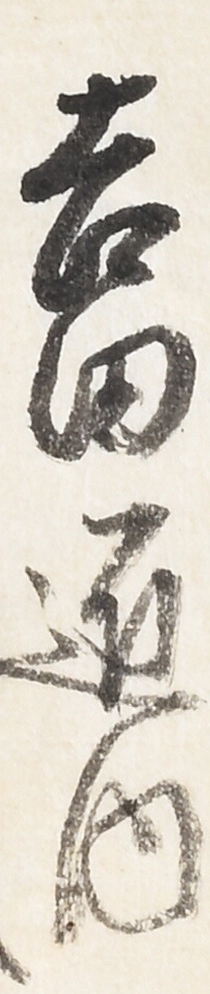吉田道内
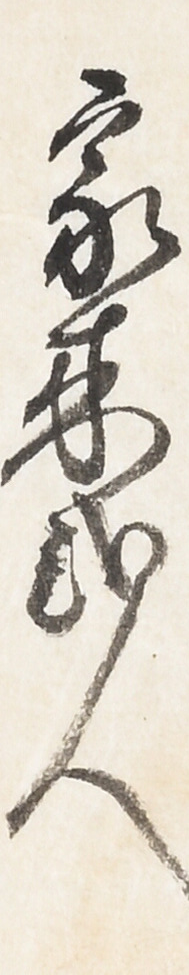家来弐人
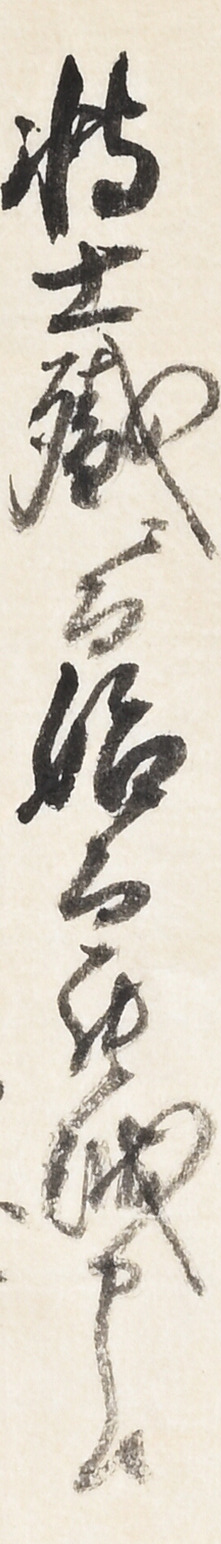転士職ニ而始而罷越申候
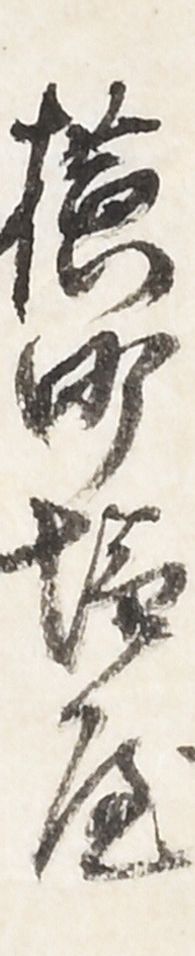横町塩屋
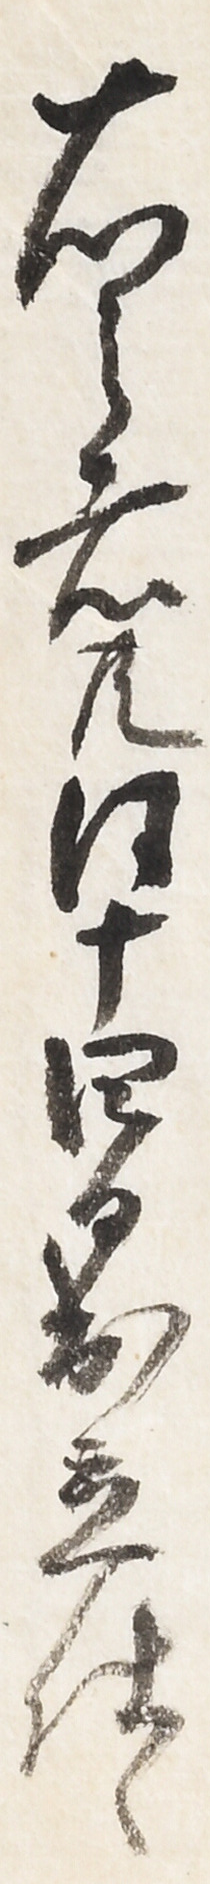右之者共同十四日出立仕候
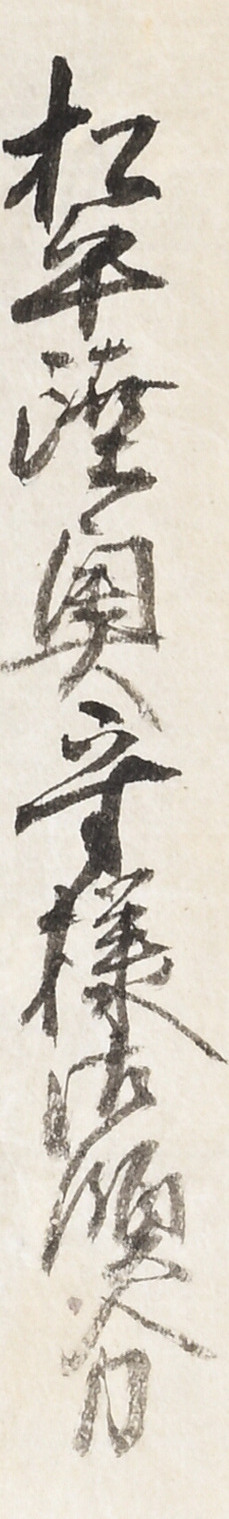松平陸奥守様御領分
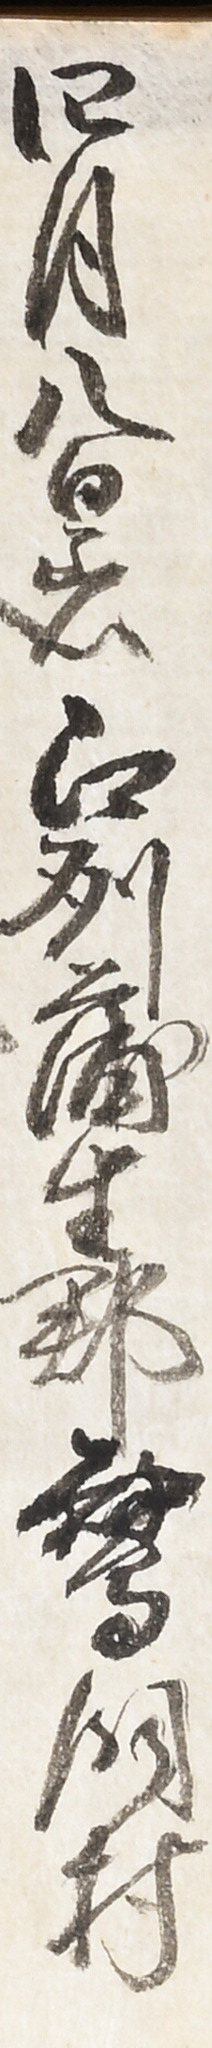四月八日着江州蒲生郡鷹飼村
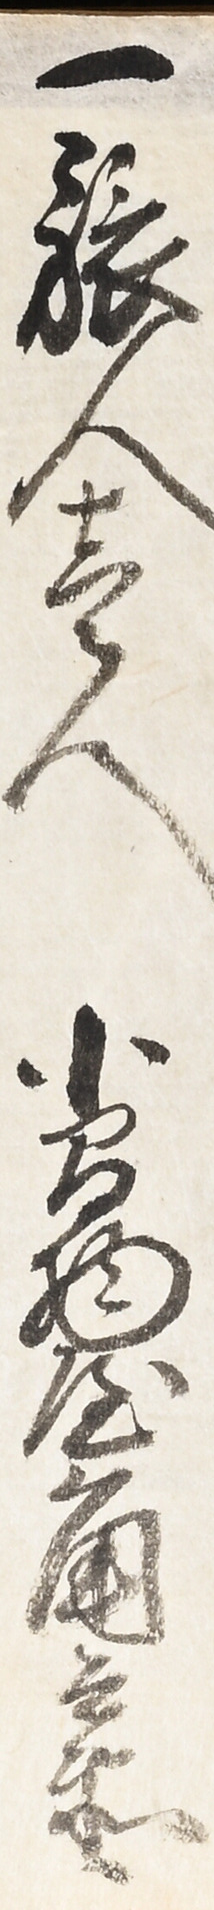一旅人壱人小間物屋角兵衛
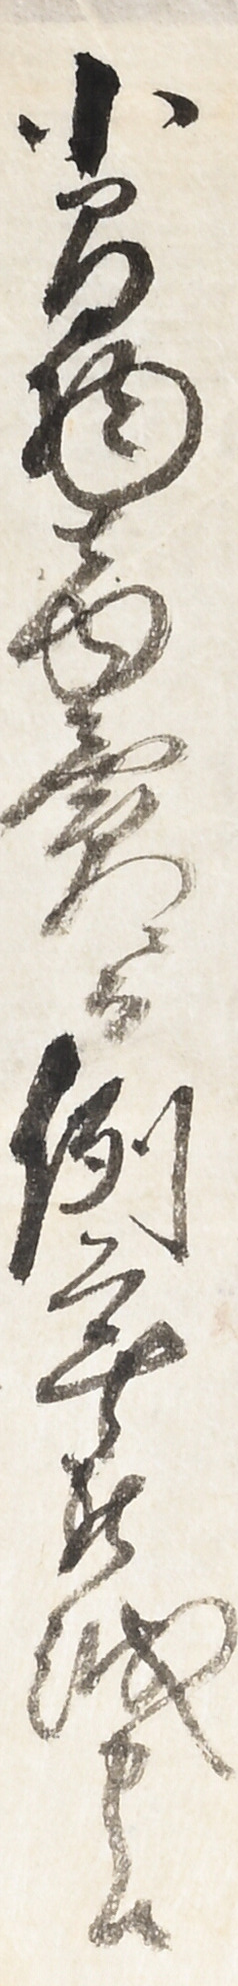小間物商売ニ而例年罷越申候
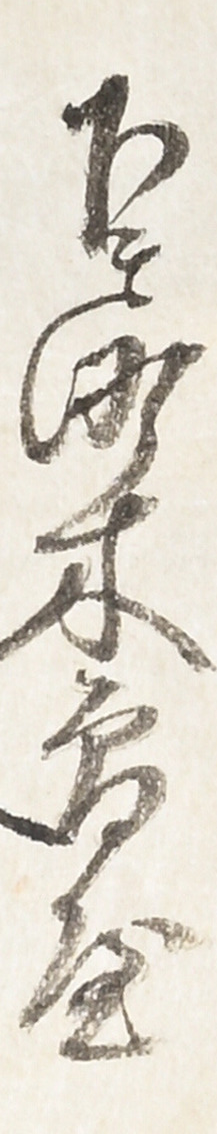下モ町木曽屋
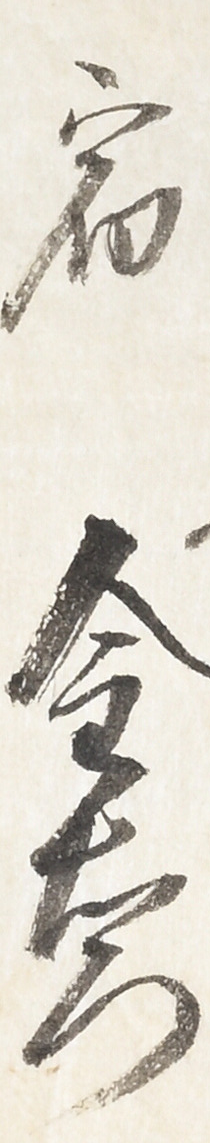宿金右衛門
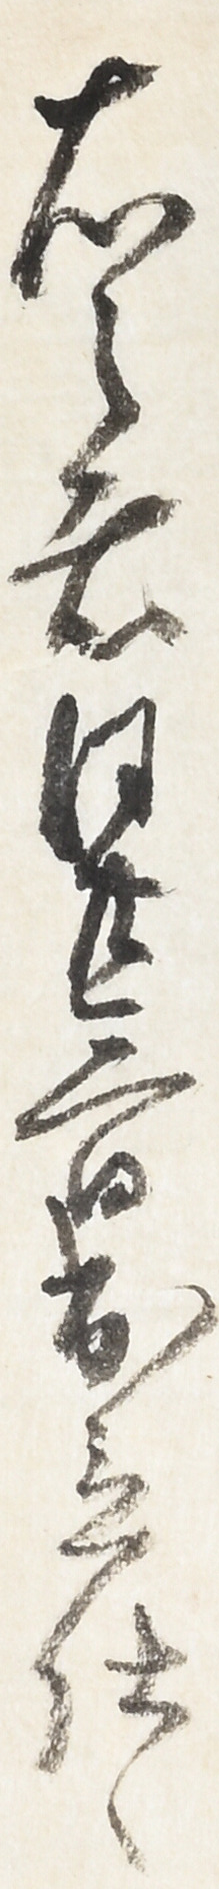右之者同廿三日出立仕候
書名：旅人泊控帳
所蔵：伊那市立高遠町図書館・合同会社AMANE
